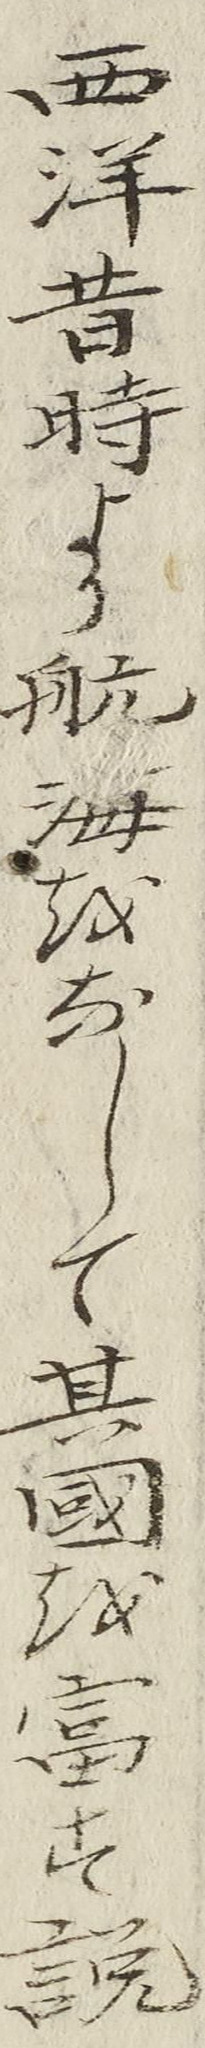西洋昔時より航海をなして其国を富す説
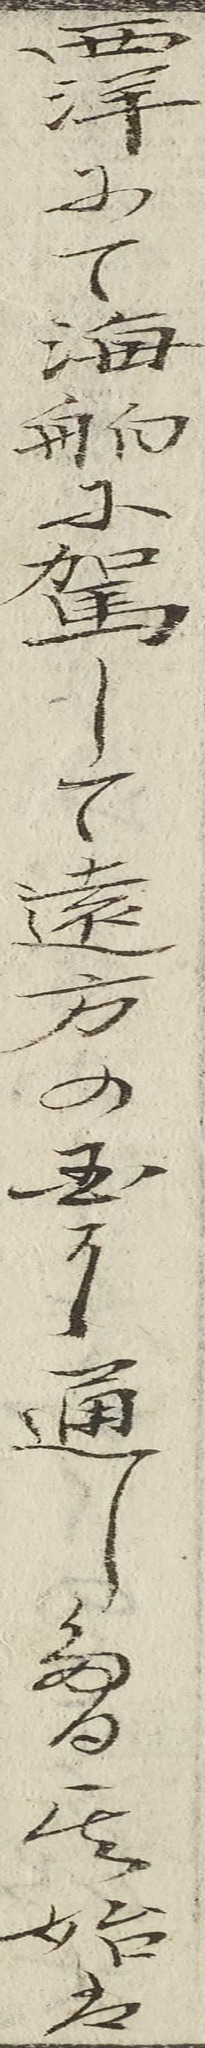西洋にて海舶に駕して遠方の国に通したる其始は
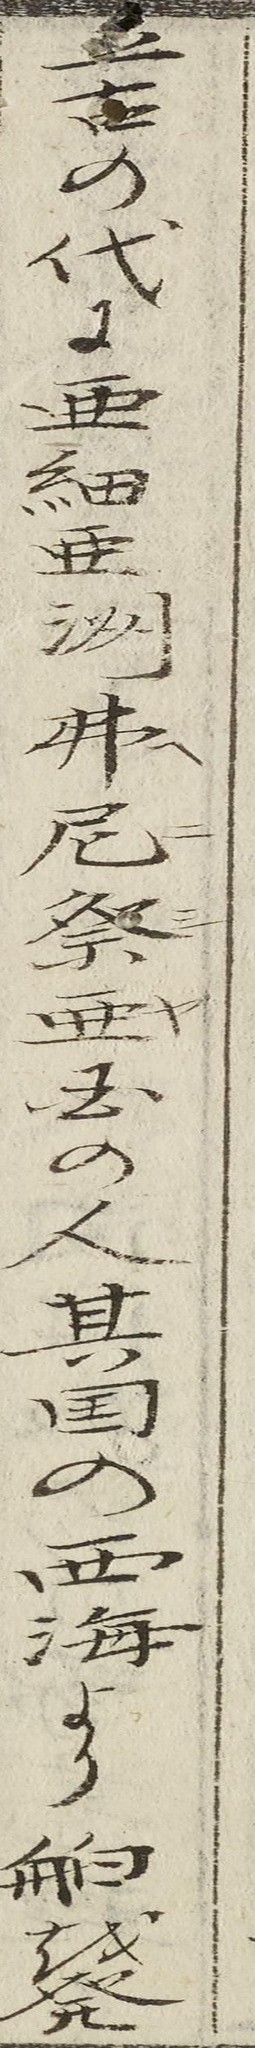上古の代に亜細亜洲弗尼祭亜国の人其匡の西海より舶を発
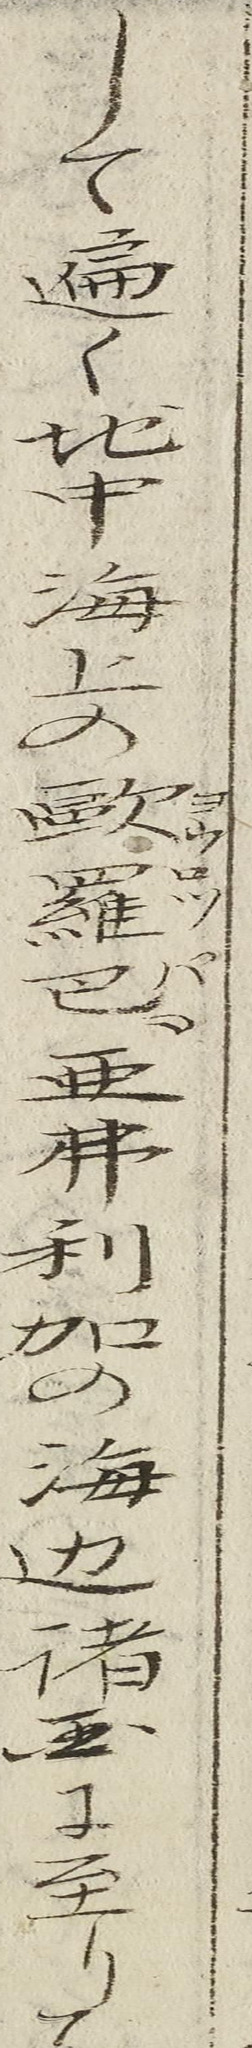して遍く地中海上の欧羅巴。亜弗利加の海辺諸国に至りて
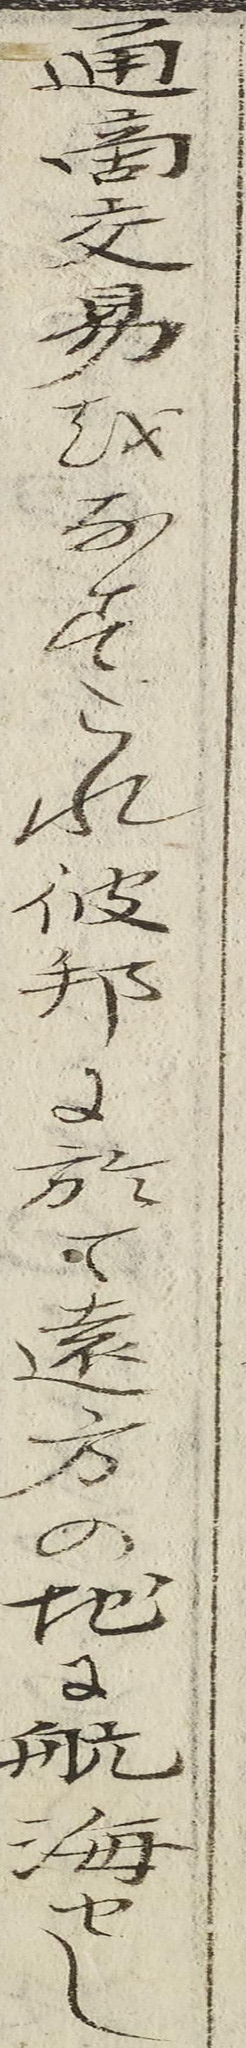通商交易をなすこれ彼邦に於て遠方の地に航海せし
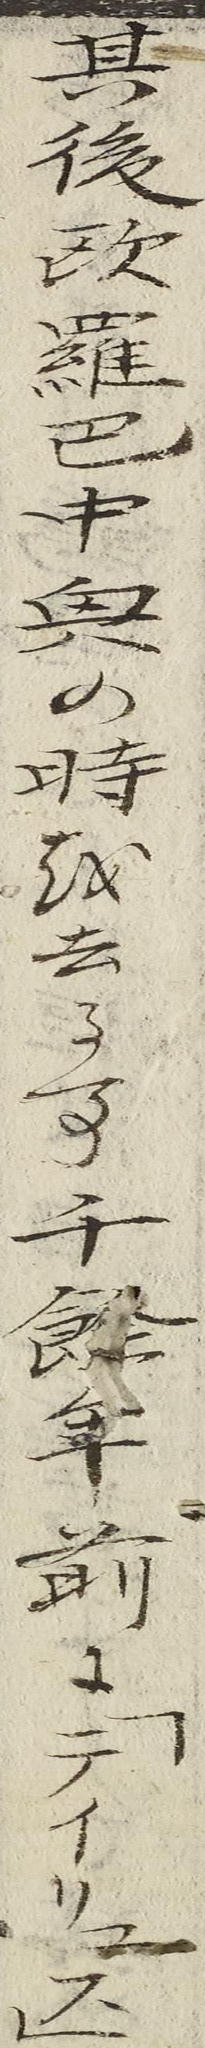其後欧羅巴中興の時を去る事千余年前に「テイリュス」
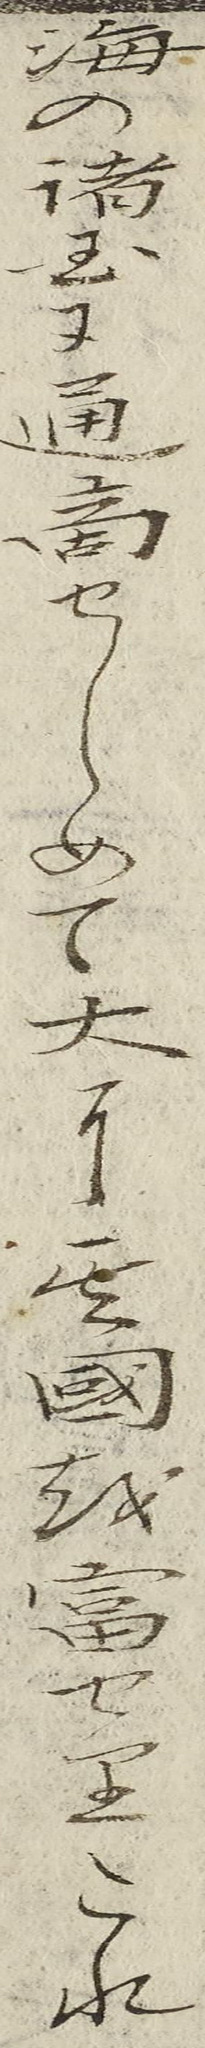海の諸国に通商せしめて大に其匡を富せりこれ
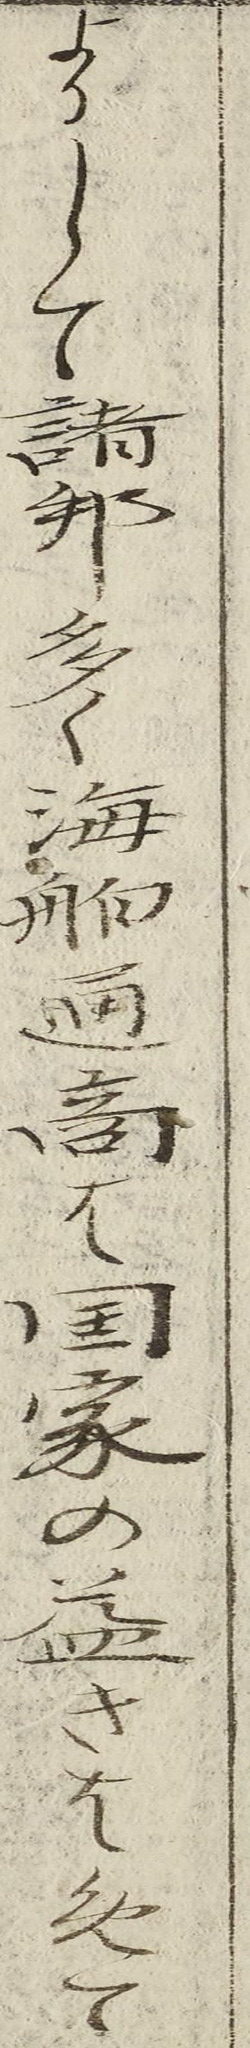よりして諸邦多く海舶通商は国家の益きはめて
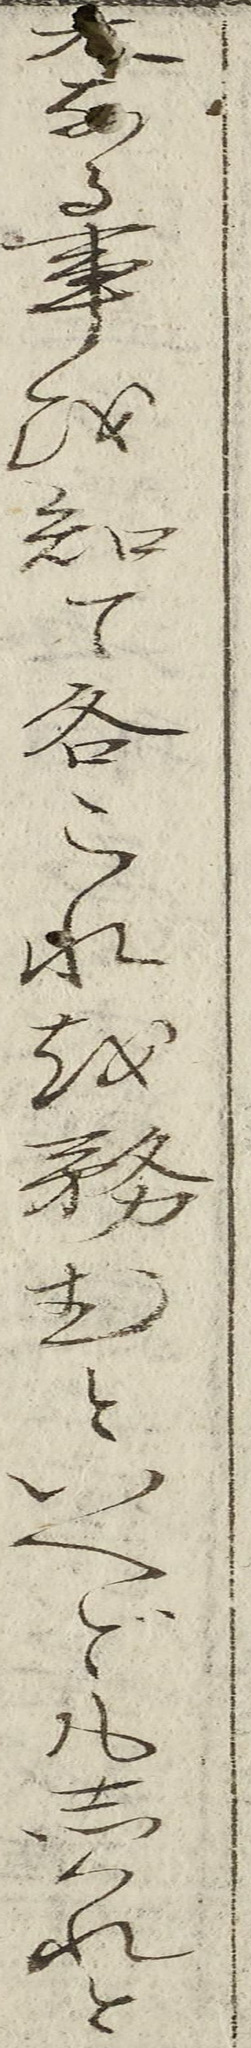大なる事を知て各これを務むといへどもしかれと
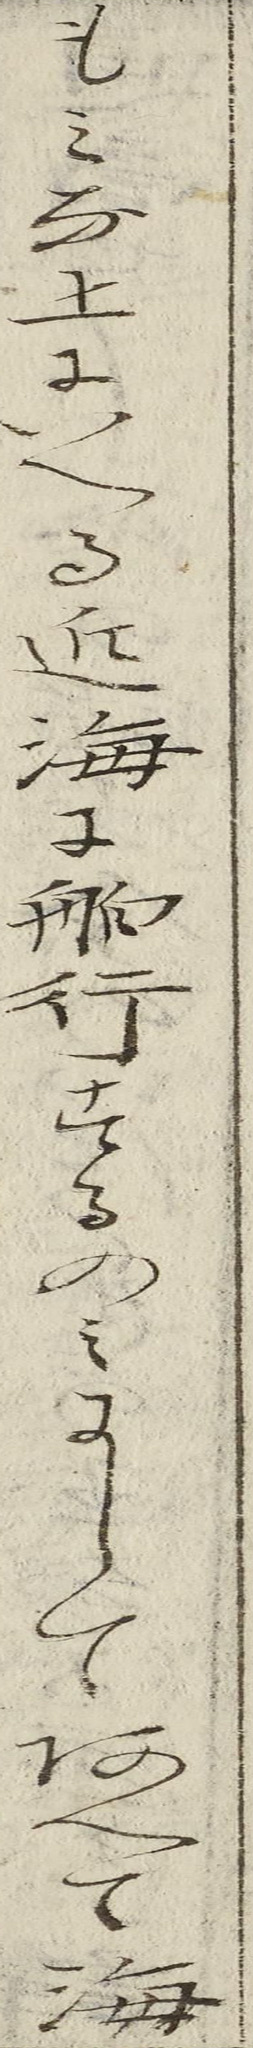もみな上にいへる近海に舶行するのみにしてあへて海
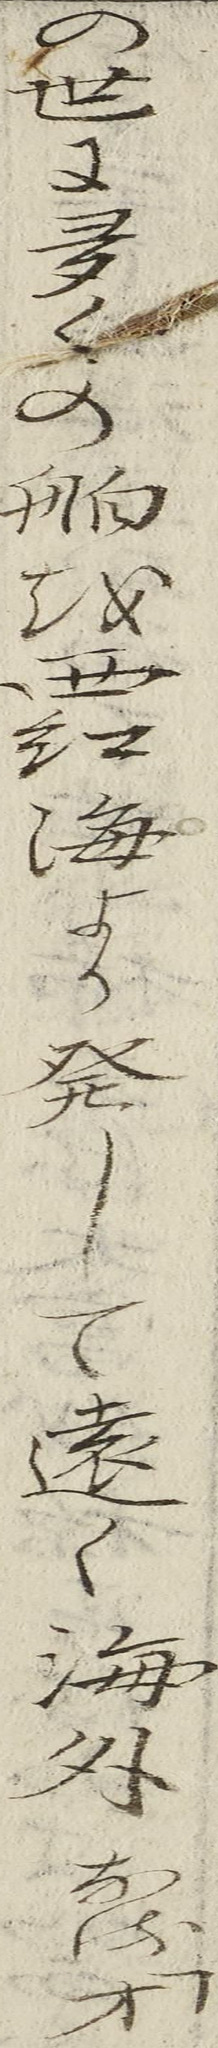の世に多くの舶を西紅海より発して遠く海外なる「オ
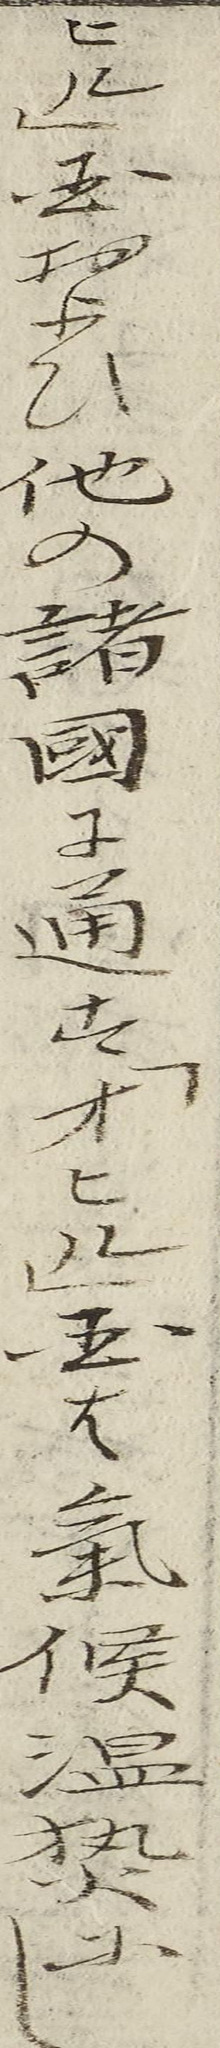ヒル」国およひ他の諸国に通す「オヒル」国は気候温熱にし
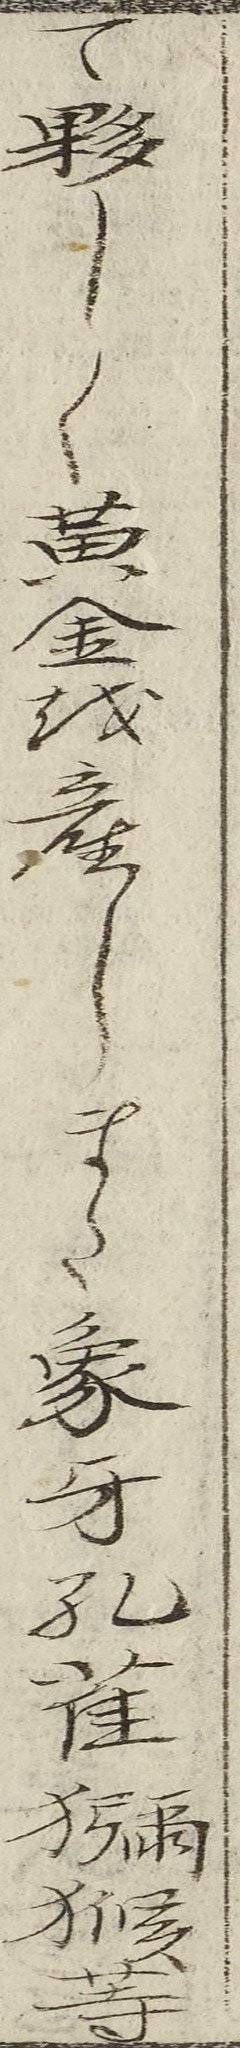て夥しく黄金を産しまた象牙孔雀獼猴等
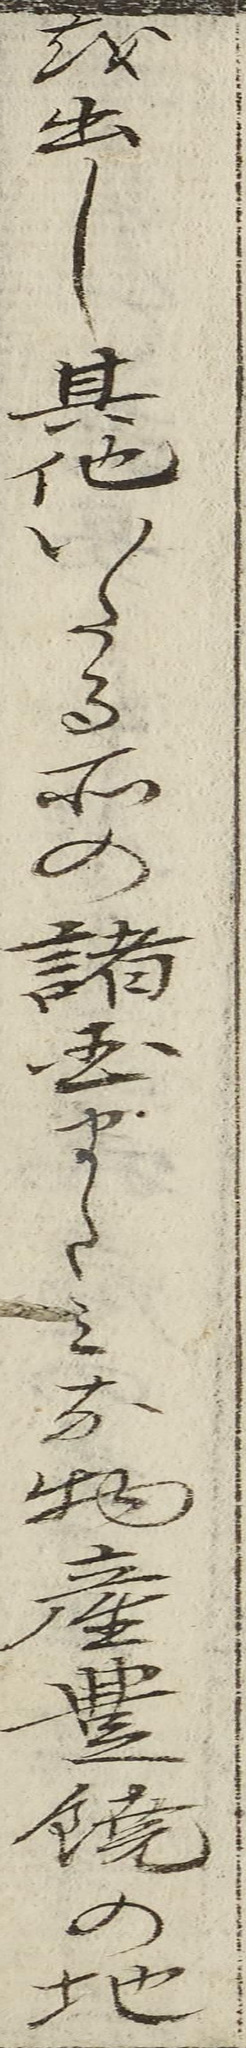を出し其他いたる所の諸国またみな物産豊饒の地

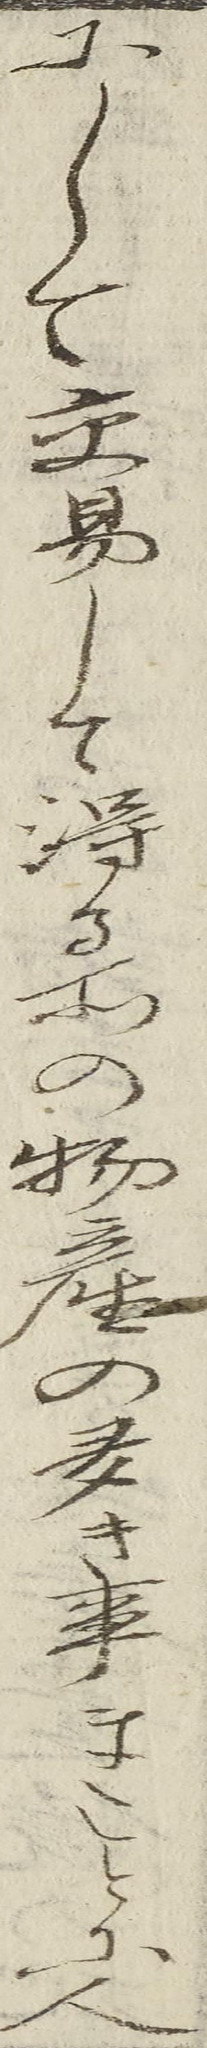にして交易して得る所の物産の多き事まことに人
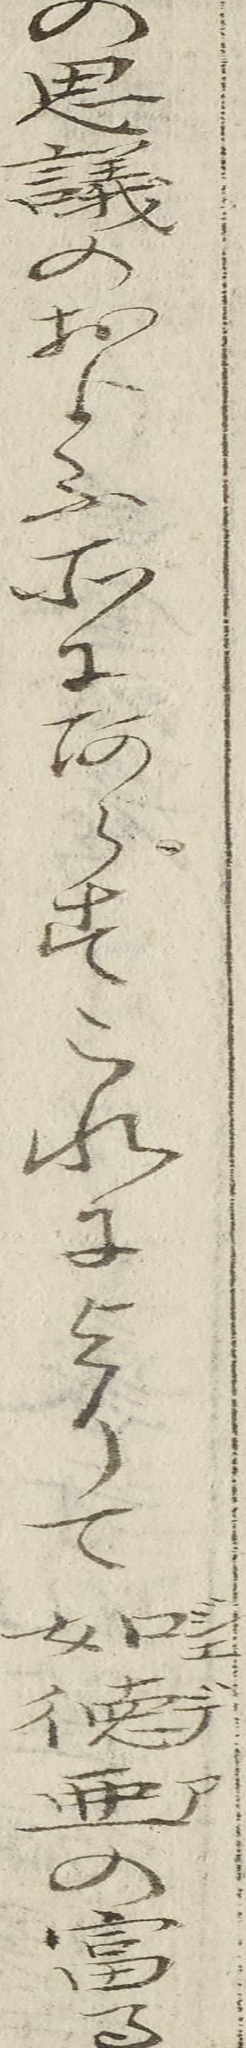の思議のおよふ所にあらすこれによりて如徳亜の富る
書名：西洋雜記　乾
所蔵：東京大学地震研究所図書室 Earthquake Research Institute Library, The University of Tokyo, JAPAN
